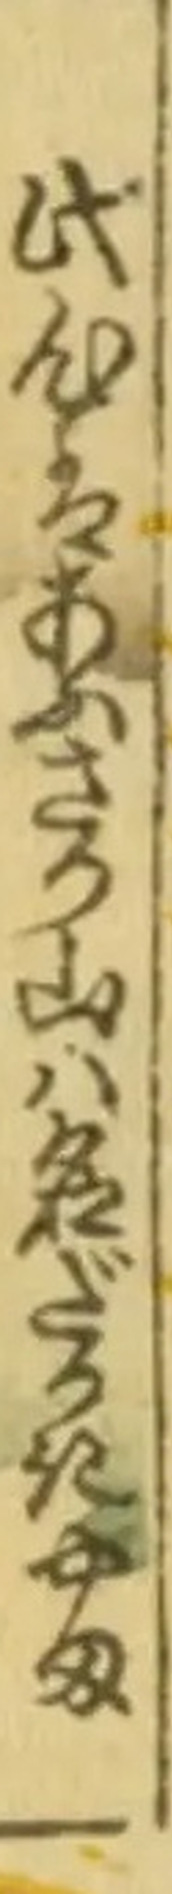此心はあふさか山は名だかきやま
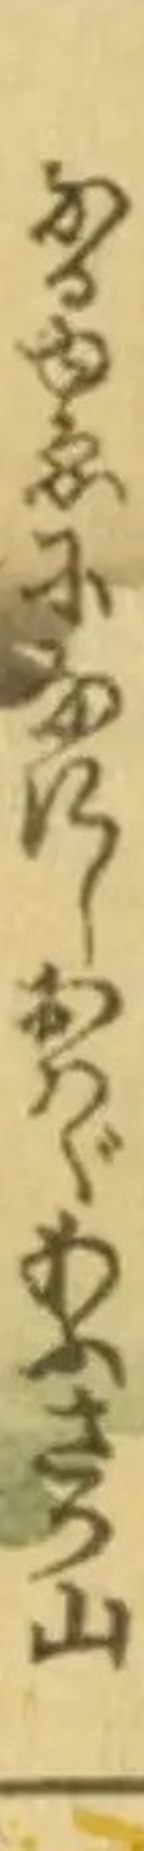なるゆゑになにしおはゞあふさか山
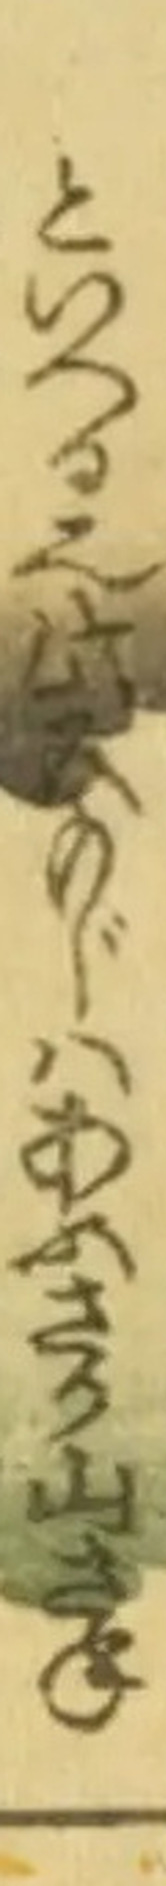といへる也此五もじはあふさか山さね
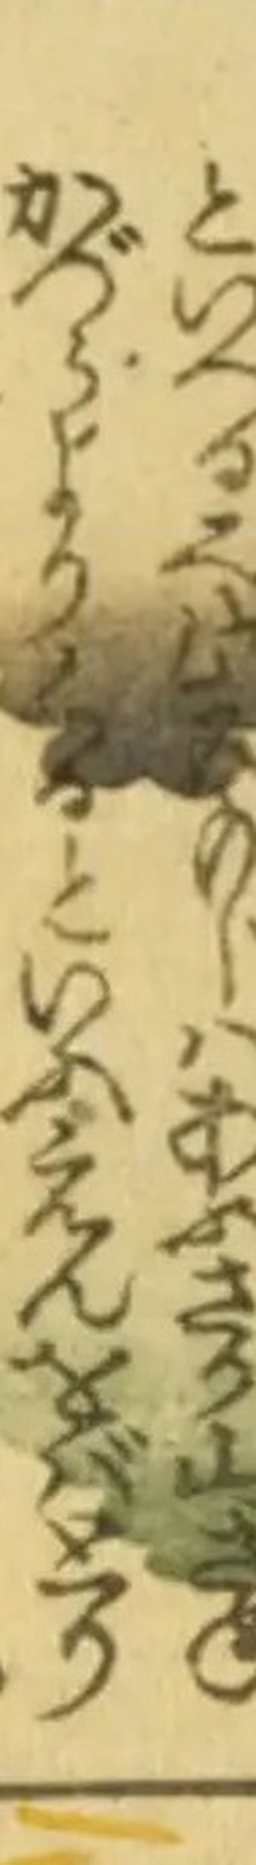かづらよりくるといふえんをばとり
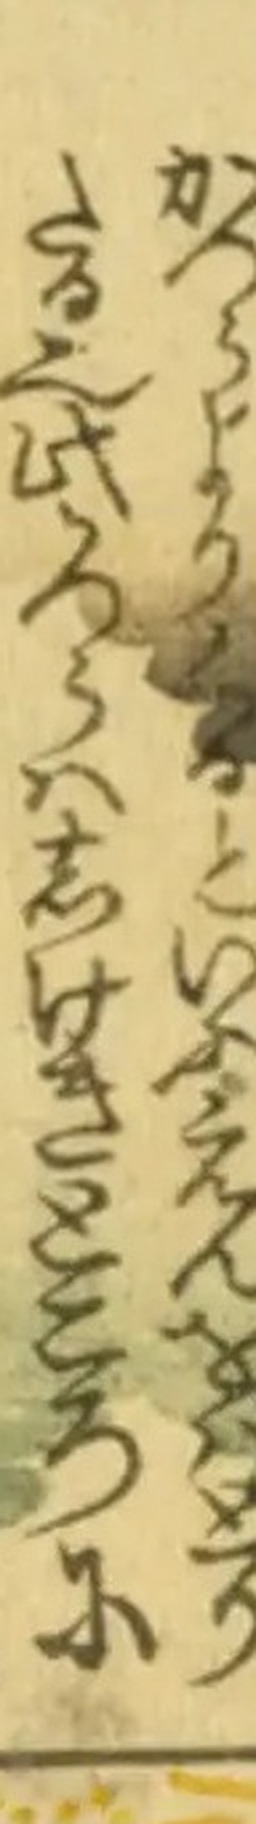たる也此かつらはしけきところに
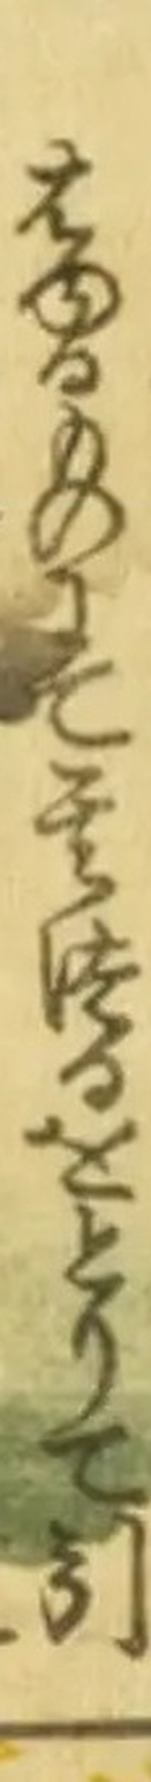はゆるものにて其つるをとりて引
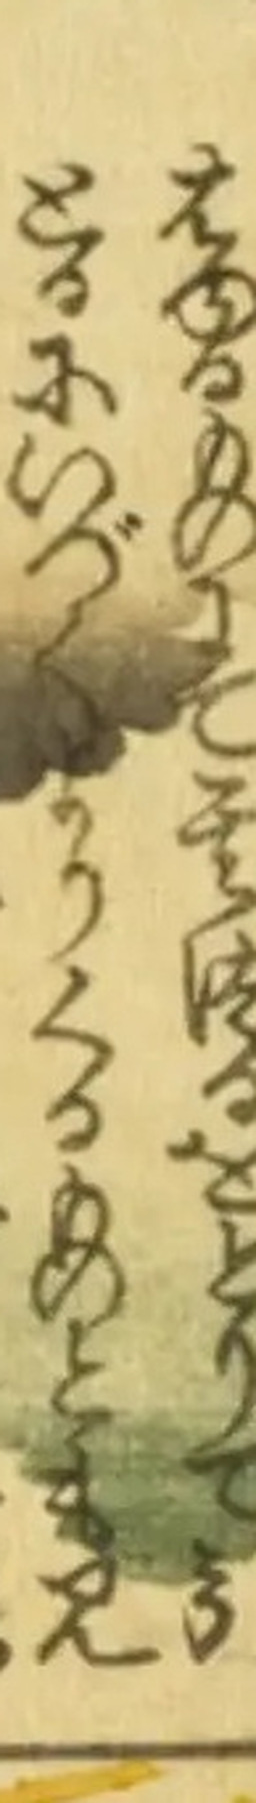とるにいづくよりくるものとも見
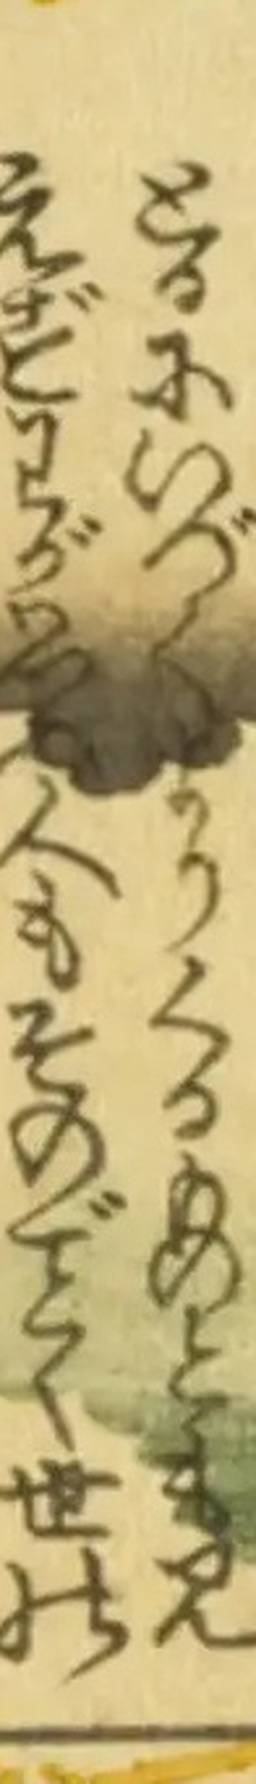えずわが思ふ人もそのごとく世の
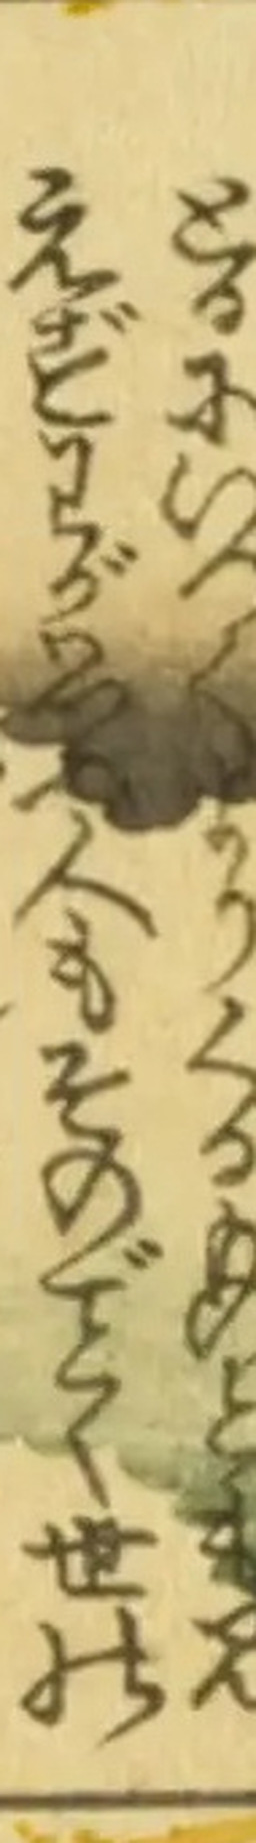えずわが思ふ人もそのごとく世の
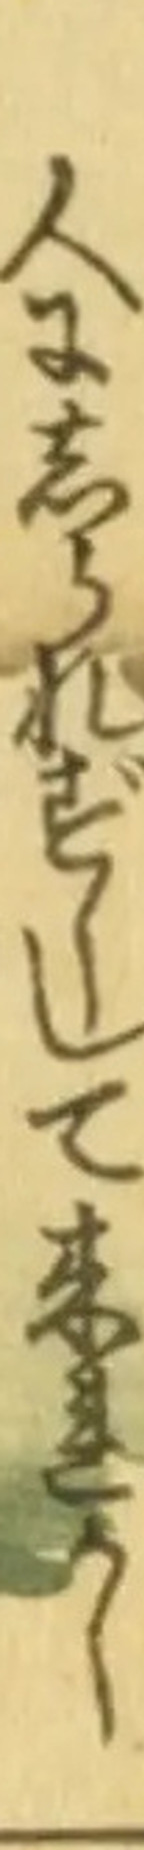人にしられずして来れかし
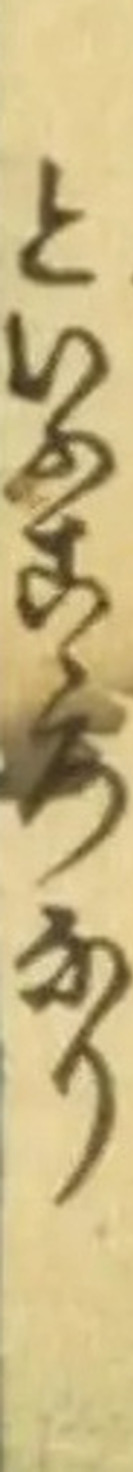といふこゝろなり
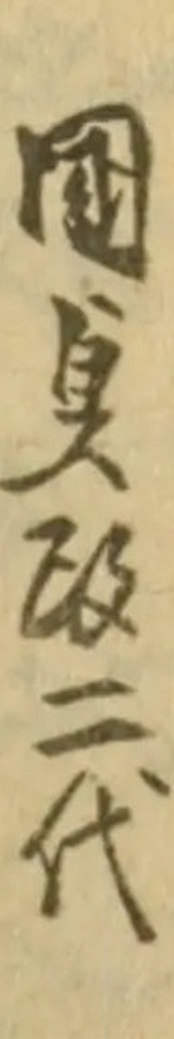国貞改二代
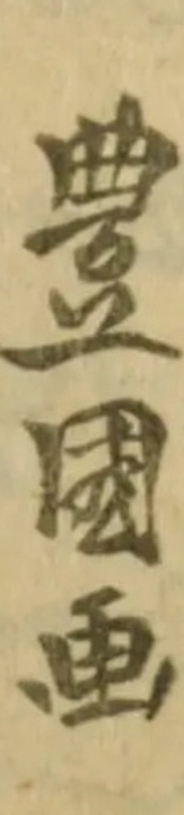豊国画
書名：百人一首絵抄 廿五 三條右大臣
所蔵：国立国会図書館 National Diet Library, JAPAN
